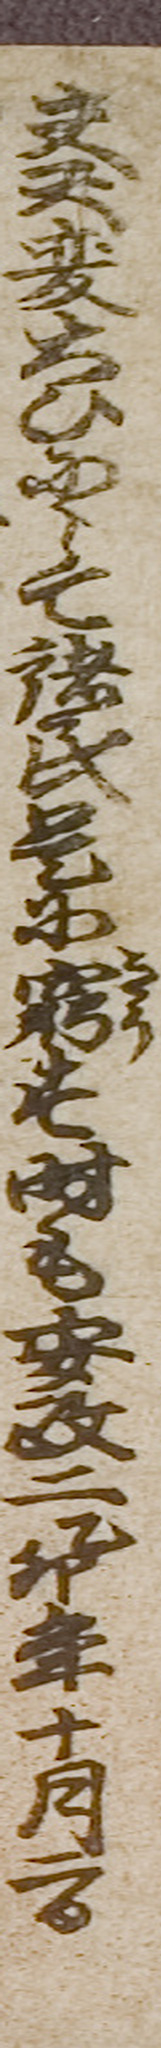夫天変ちひにして諸民是に窮す時も安政二乙卯年十月二日
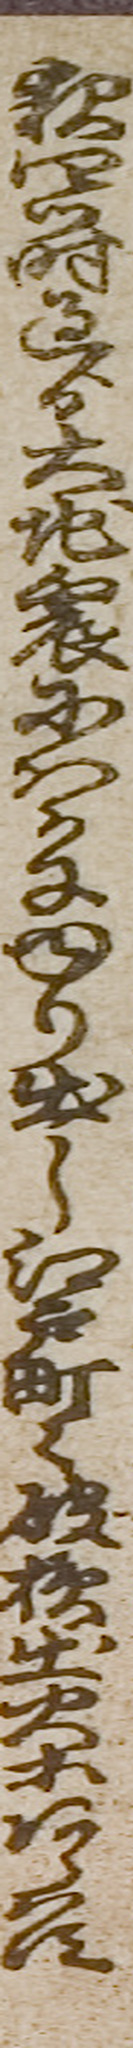夜四ツ時過ゟ大地震にはかにゆり出し江戸町々破損出火等あらはす
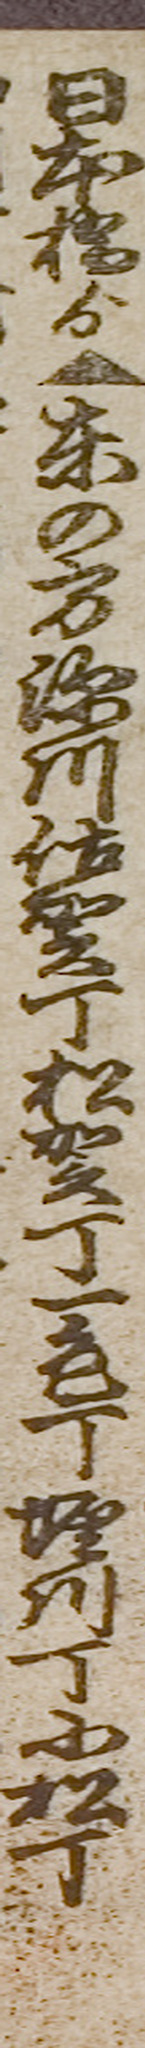日本橋ゟ▲東の方深川佐賀丁松賀丁一色丁堀川丁小松丁
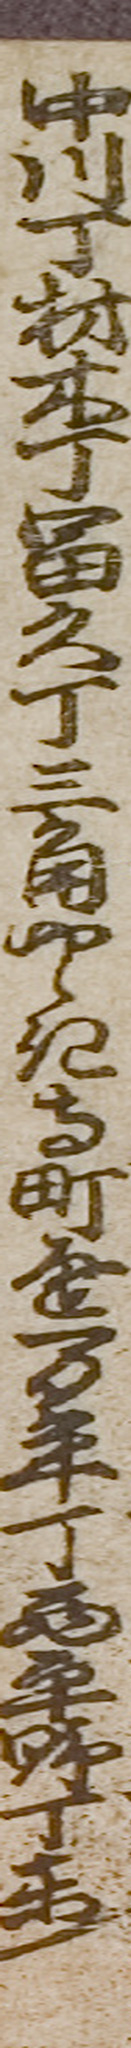中川丁材木丁富久丁三角やしき寺町通万年丁西平野丁東
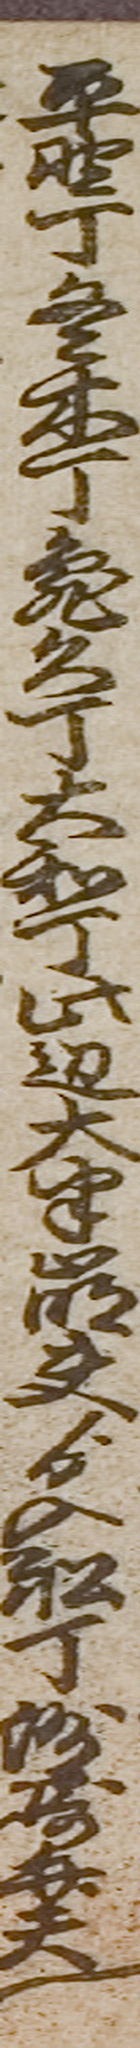平野丁冬木丁亀久丁大和丁此辺大半崩夫ゟ入船丁洲崎弁天
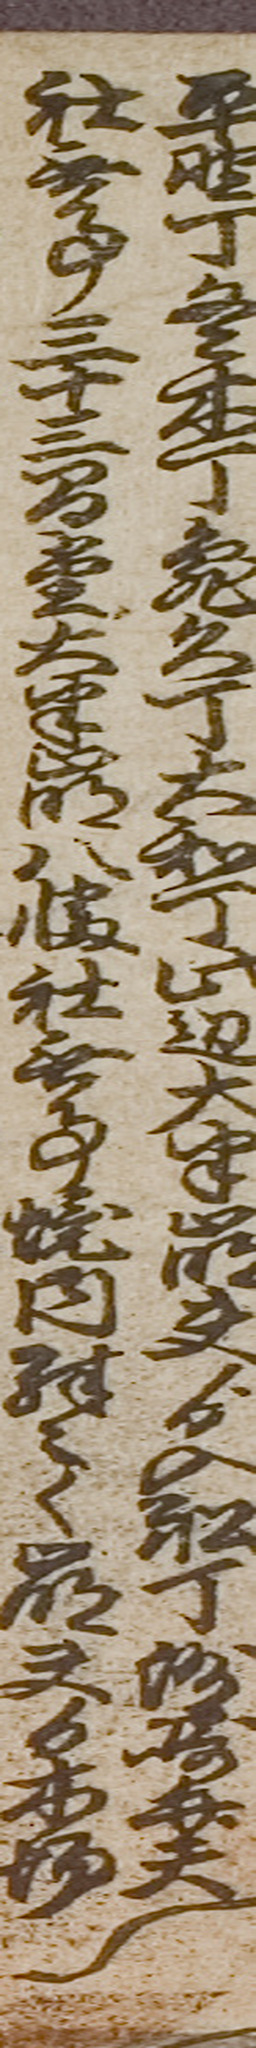社無事三十三間堂大半崩八幡社無事境内殊々く崩夫ゟ木場
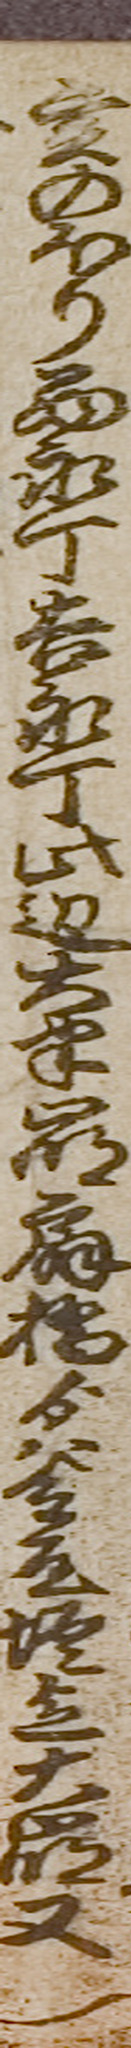亥のほり西永丁吉永丁此辺大半崩扇橋ゟ釜屋堀迄大崩又
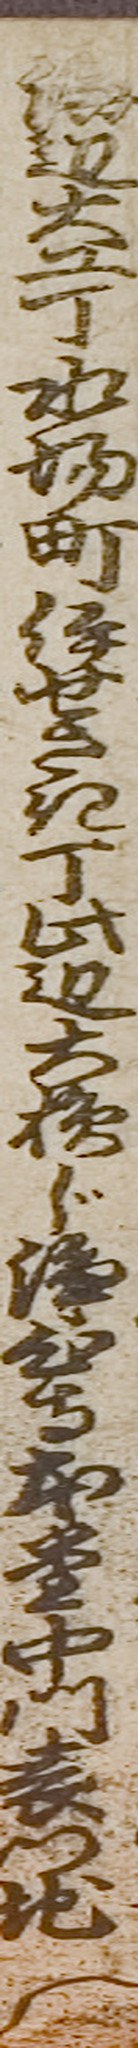海辺大工丁水場丁伊せさき丁此辺大損じ浄心寺本堂中門表門地
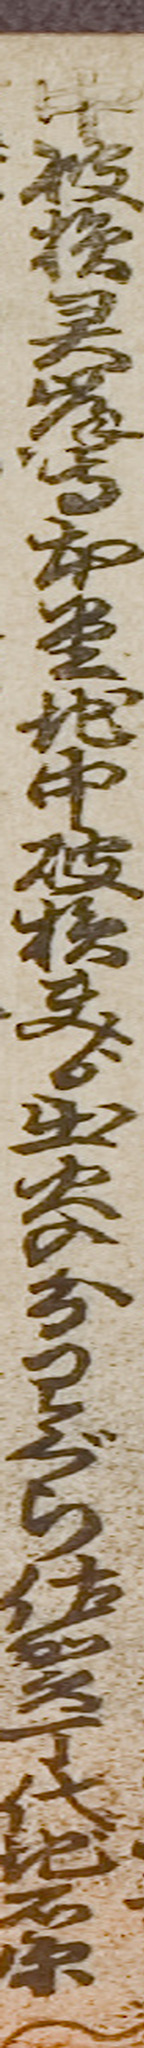中破損霊岸寺本堂地中破損夫ゟ出火の分わぐら佐賀丁代地石原
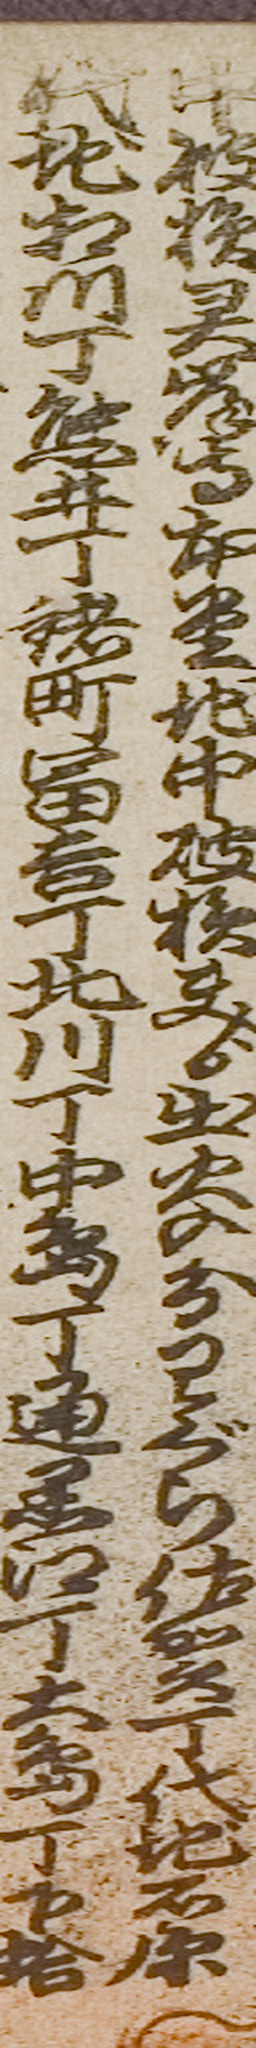代地相川丁熊井丁諸丁富吉丁北川丁中島丁通黒江丁大島丁下蛤
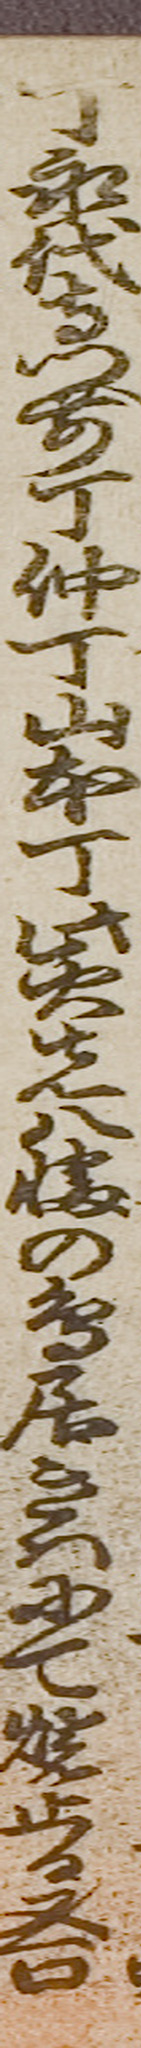丁永代寺門前丁仲丁山本丁此火先八幡の鳥居きはにて焼止る又一口
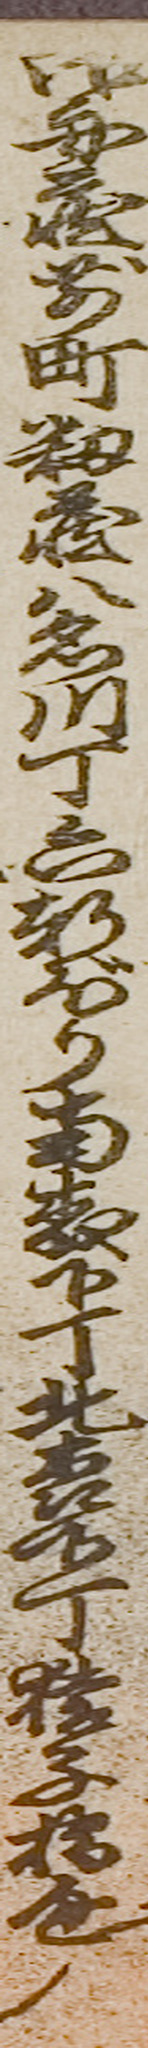御舟蔵前町籾蔵八名川丁六軒ぼり南森下丁北森下丁猿子橋通
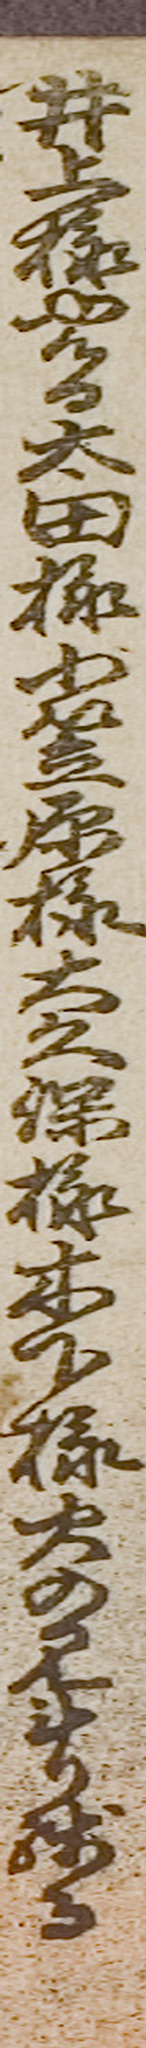井上様やける太田様小笠原様大久保様木下様火の見斗り残る
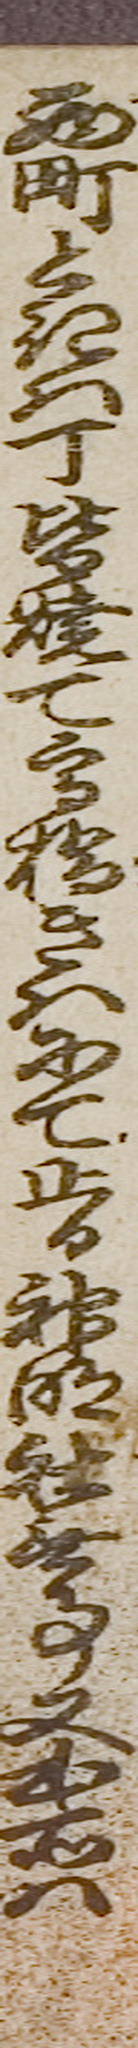西町ときは丁皆焼て高橋きはにて止る神明社無事又本所は
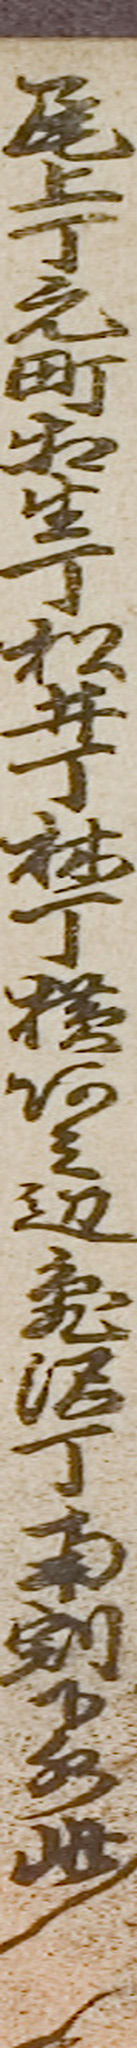尾上丁元町相生丁松井丁林丁横あみ辺亀沢丁南割下水此
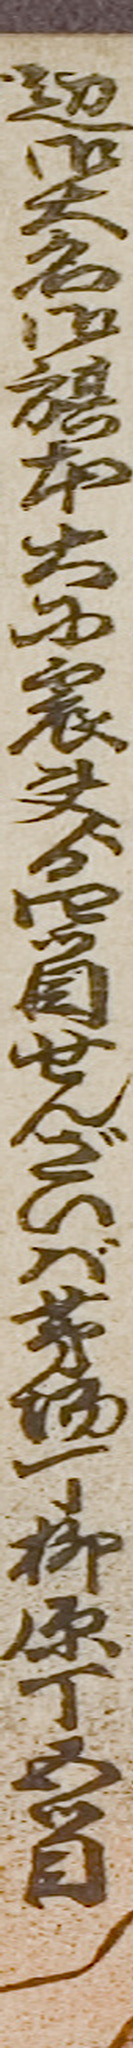辺御大名御旗本大に震夫ゟ四つ目せんざいば茅場丁柳原丁五ツ目
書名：[安政地震状況図]
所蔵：東京大学総合図書館 General Library in the University of Tokyo, JAPAN
